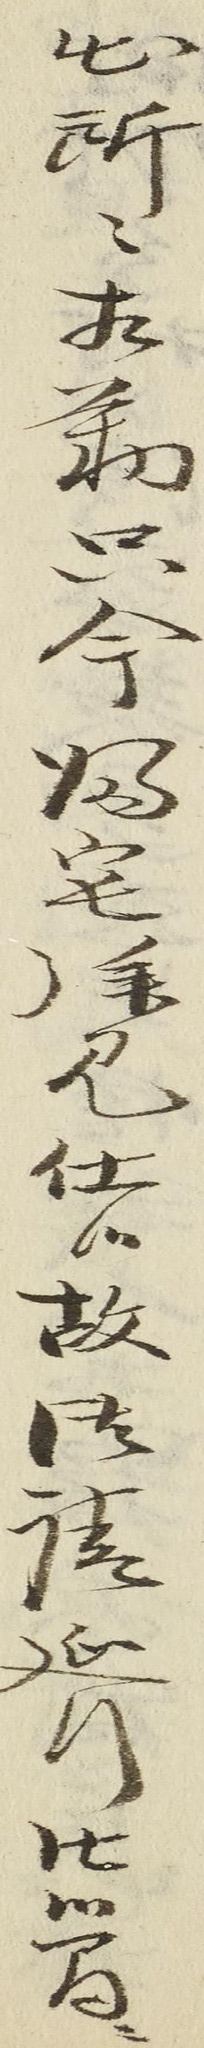出所々相勤只今帰宅拝見仕候故御請延引仕候間二
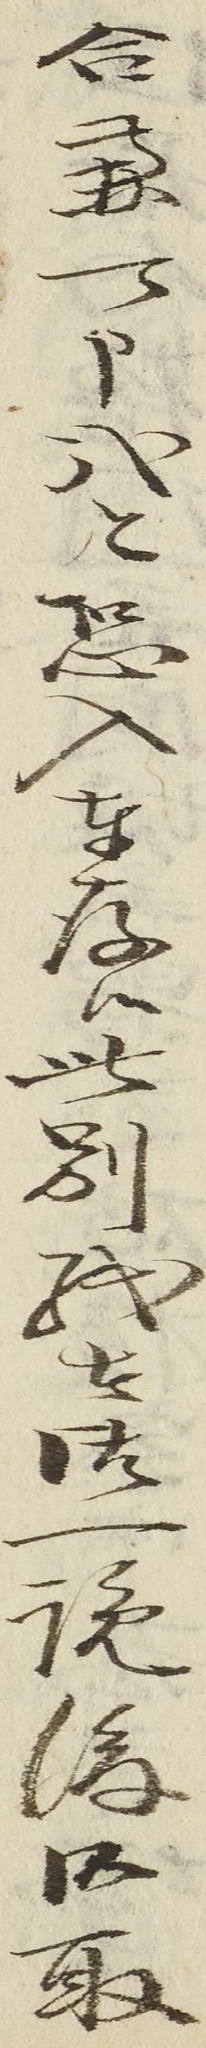会兼可申哉と恐入奉存候此別紙は御一覧後御取
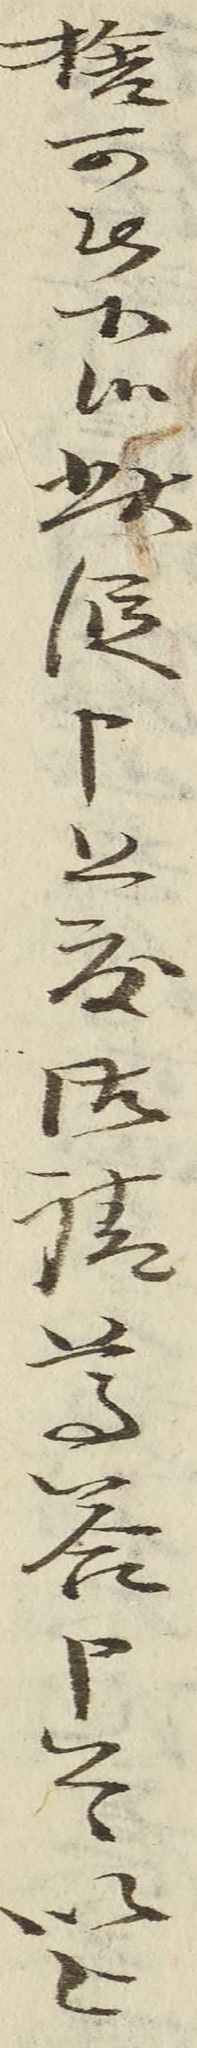捨可被下候此段申上度御読尊答申上候以上
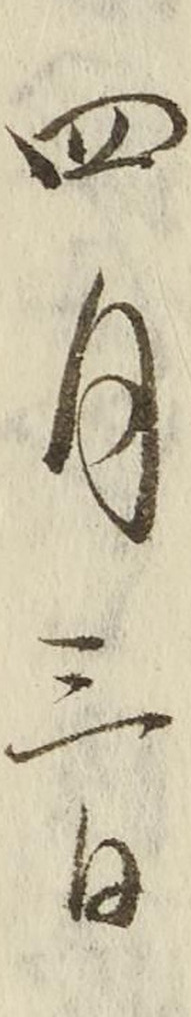四月三日

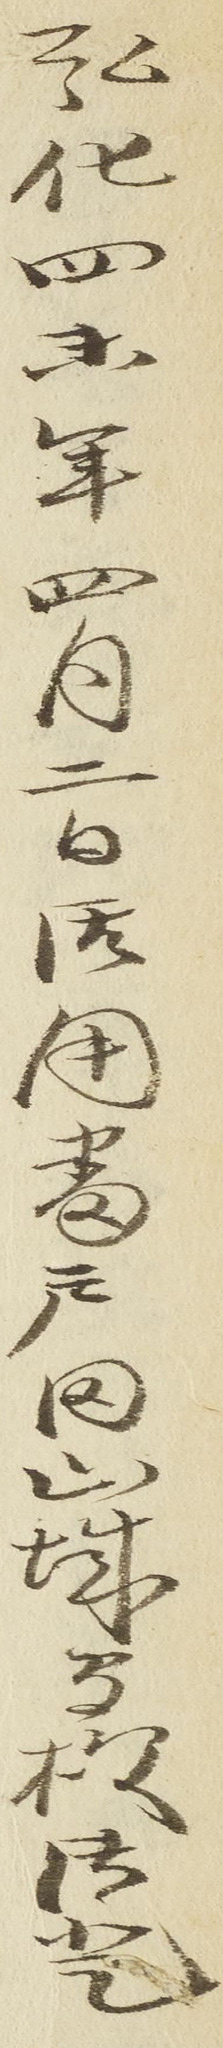弘化四未年四月二日御用番戸田山城守様御登
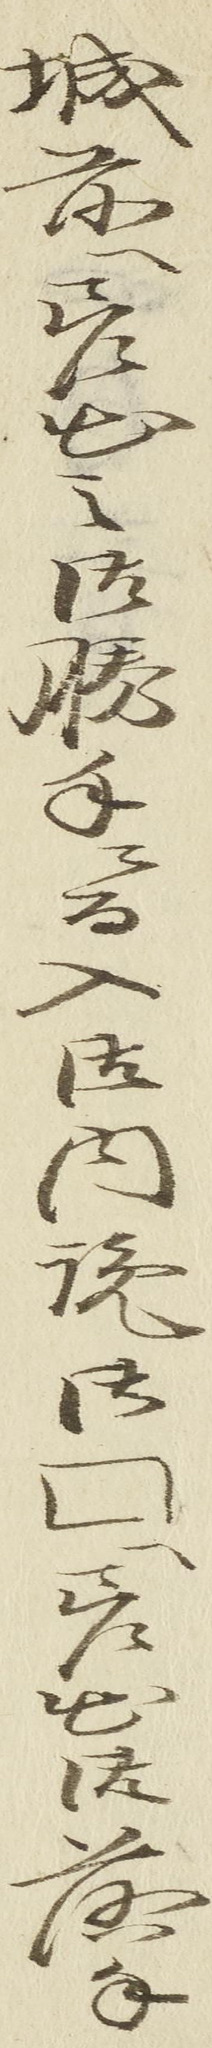城前へ差出之御勝手二而入御内読御口へ差出御落手
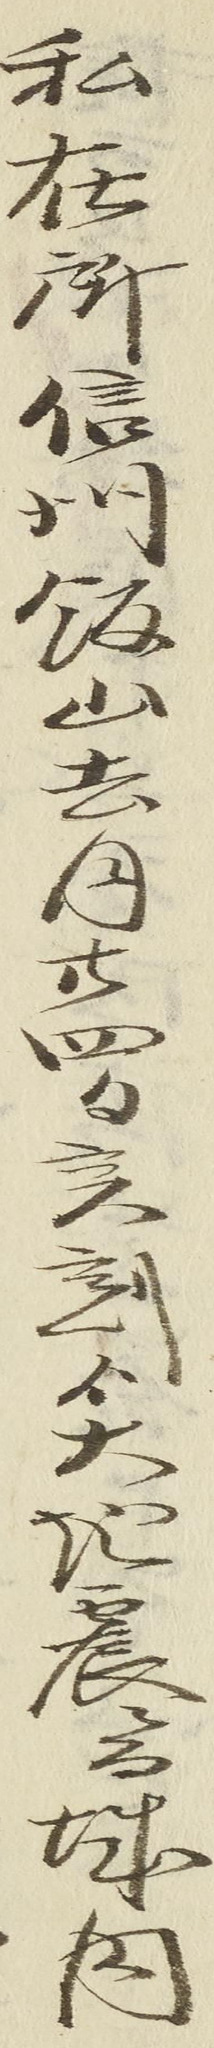私在所信州飯山去月廿四日亥刻ゟ大地震二而城内
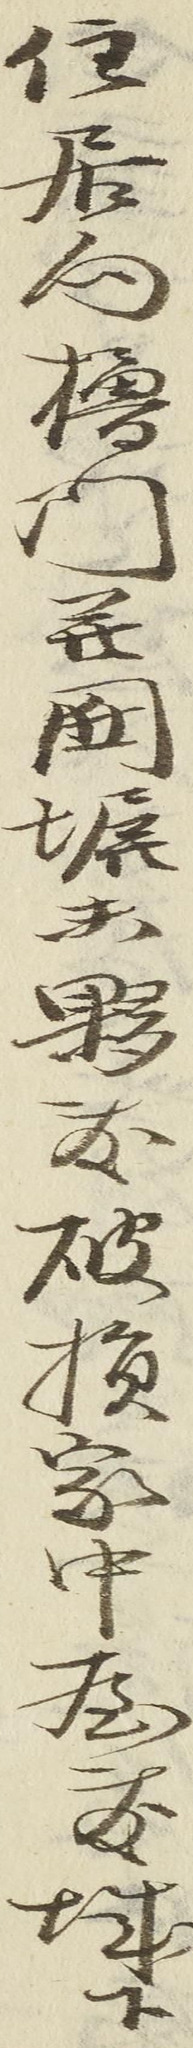住居向櫓門并囲塀等夥敷破損家中屋敷城下
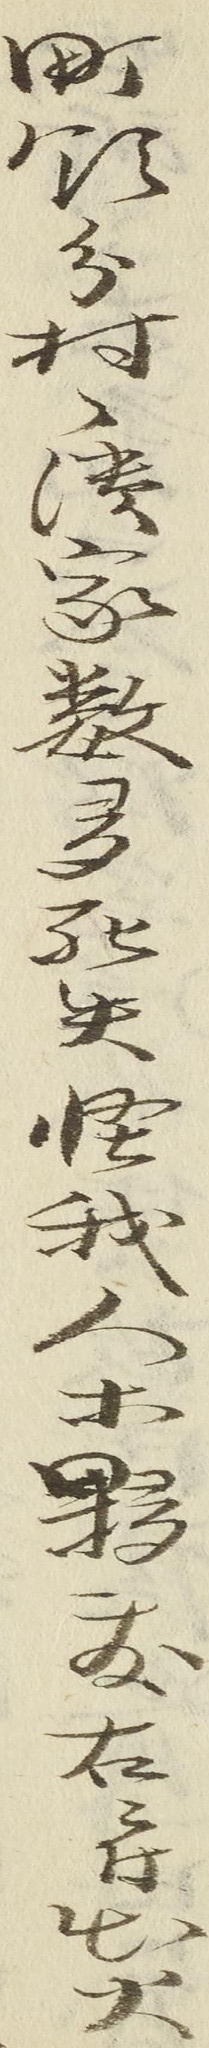町領分村々潰家数多死失怪我人等夥敷右二付出火
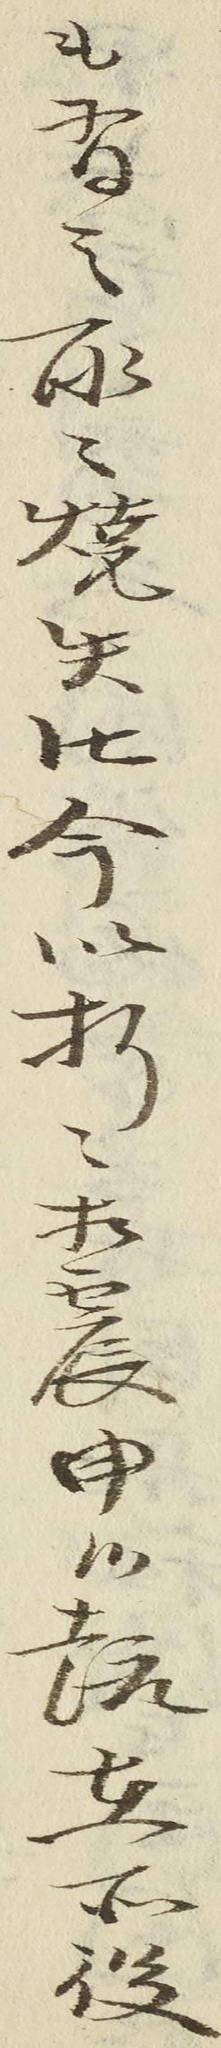も有之所々焼失仕今以折々相震申候趣在所役
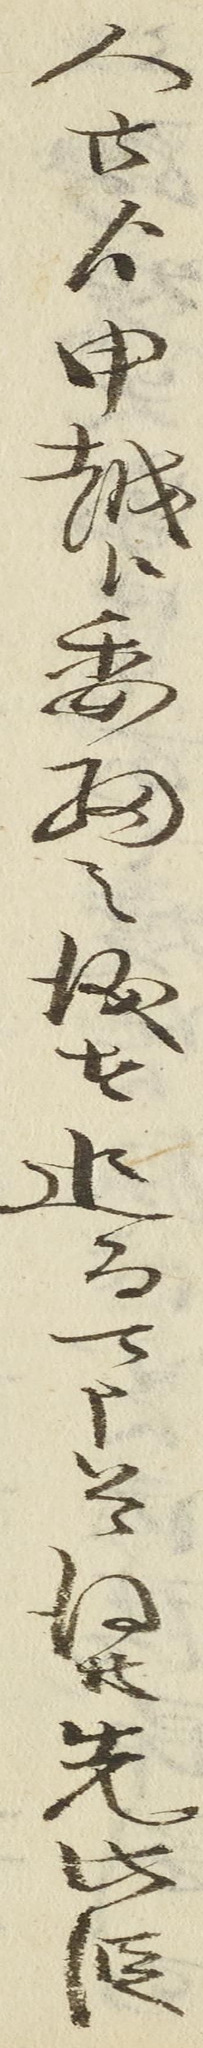人共ゟ申越候委細之儀は追而可申上候得共先此段
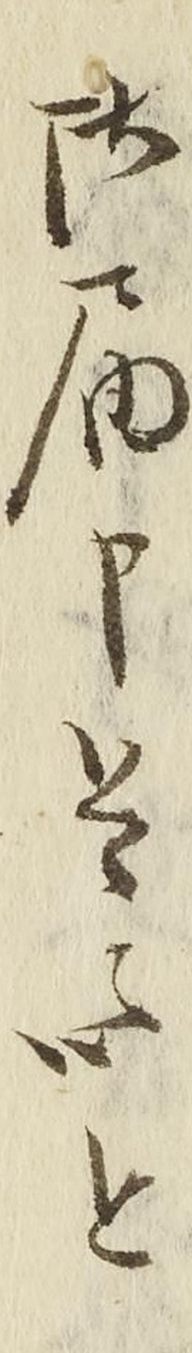御届申上候以上
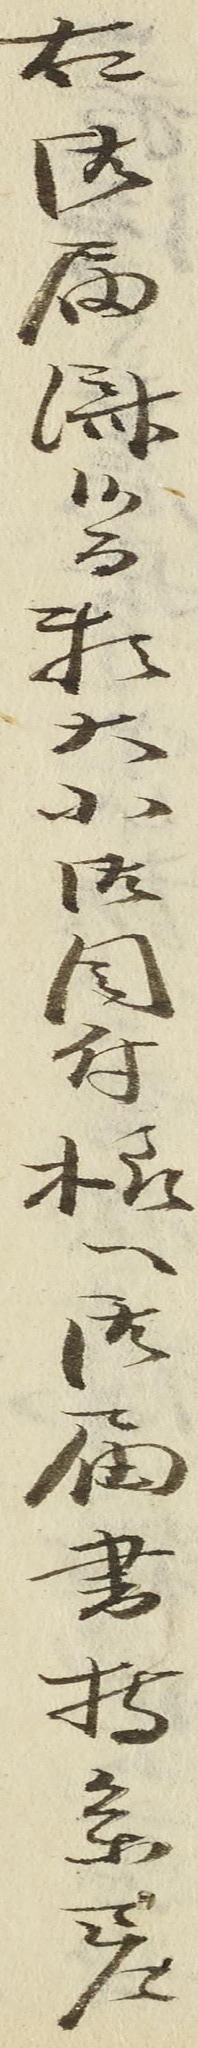右御届済候而口大小御目付様へ御届書持参差
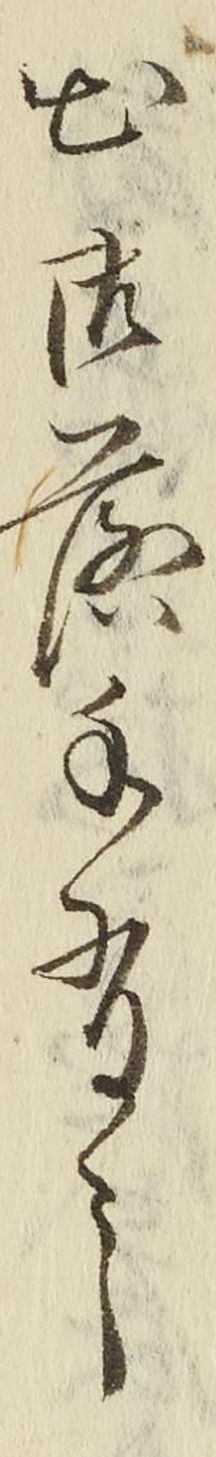出御落手有之
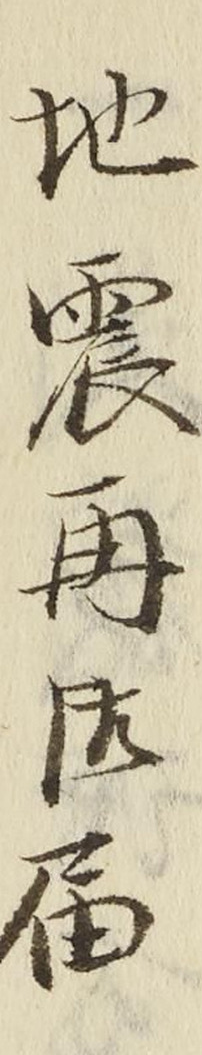地震再御届
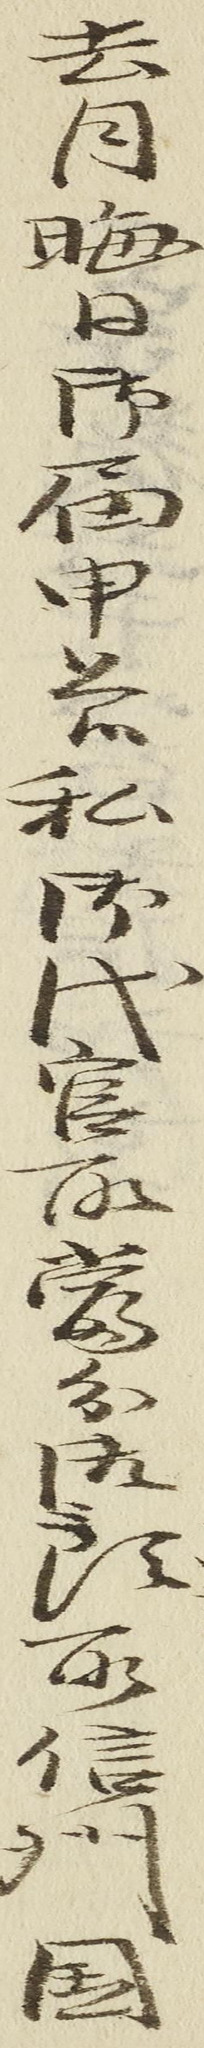去月晦日御届申上候私御代官所当分御預所信州国
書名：信濃國大地震記　乾
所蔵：東京大学地震研究所図書室 Earthquake Research Institute Library, The University of Tokyo, JAPAN
